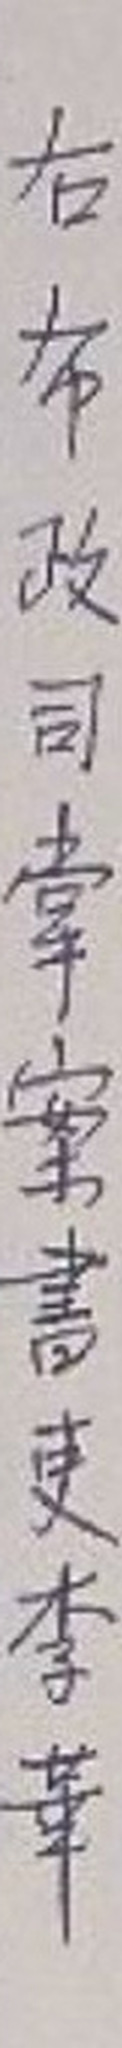右布政司掌案書吏李華
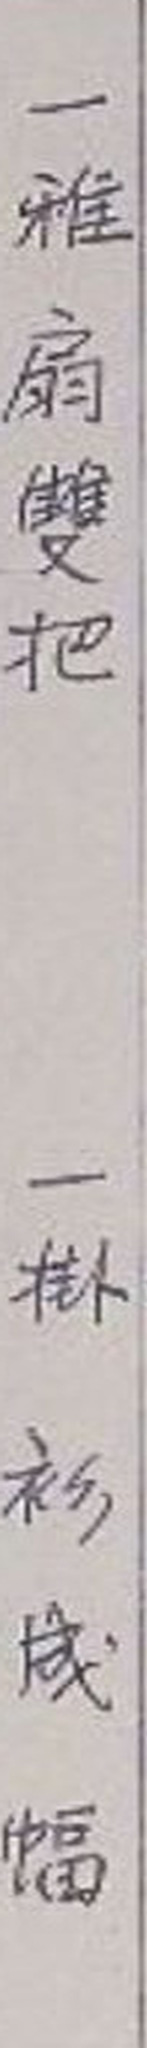一雅扇雙把一掛衫成幅

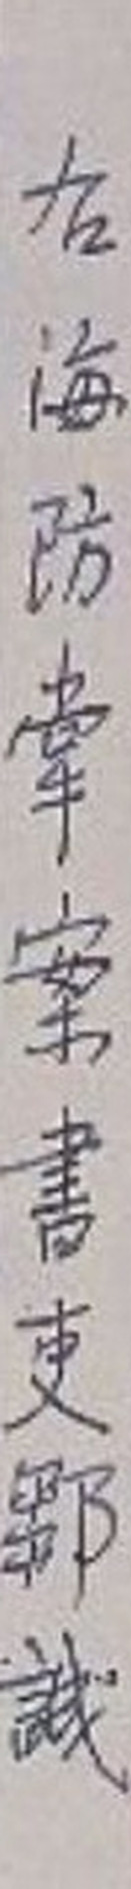右海防掌案書吏鄒誠
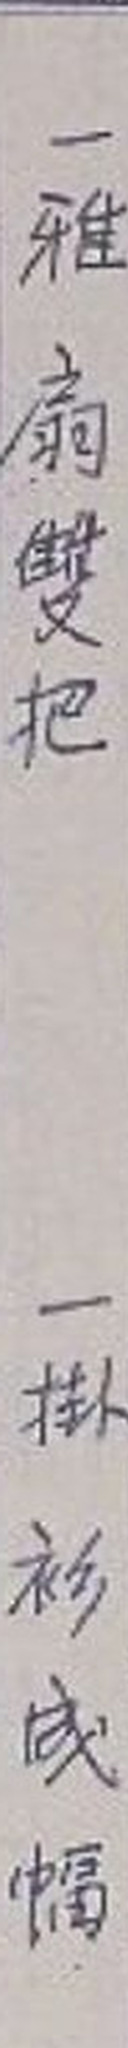一雅扇雙把一掛衫成幅
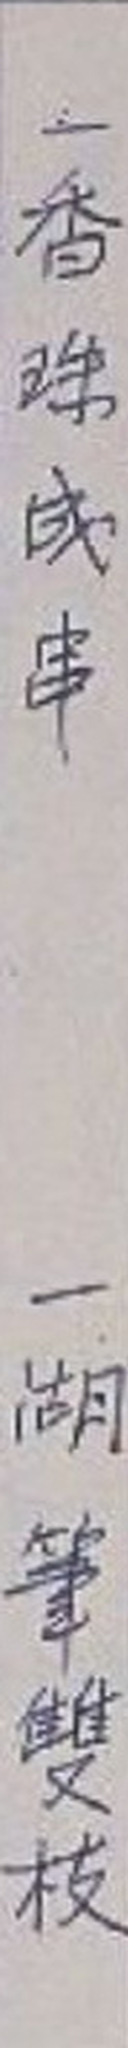一香珠成串一湖筆雙枝
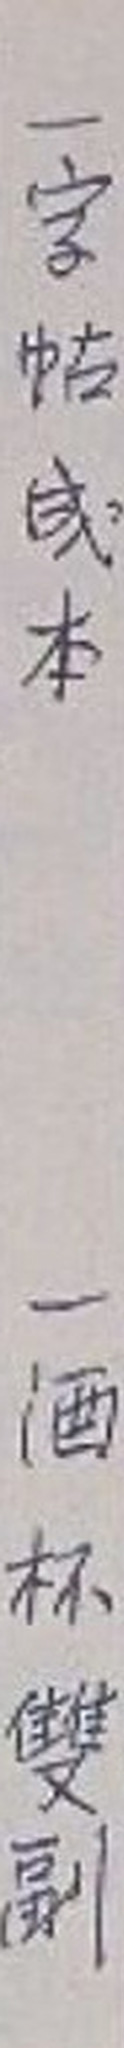一字帖成本一酒杯雙副
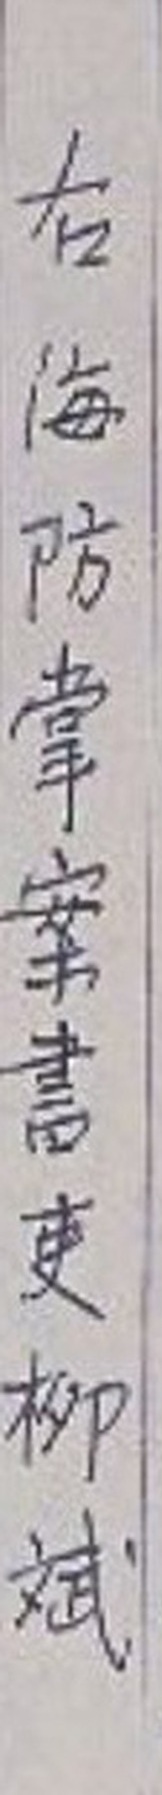右海防掌案書吏柳斌
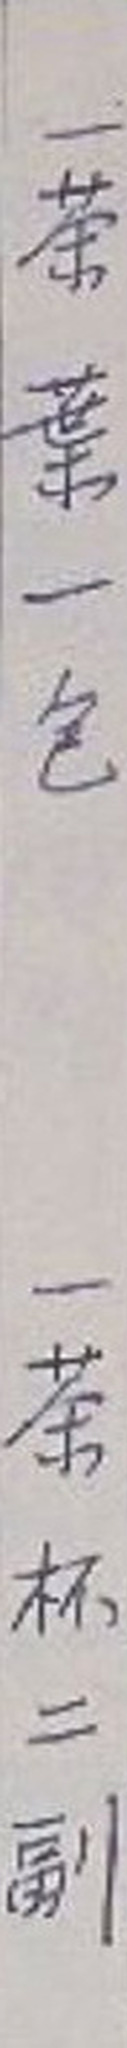一茶葉一包一茶杯二副
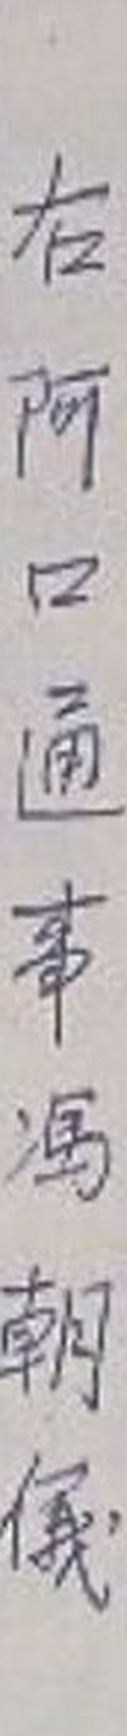右阿口通事馮朝儀
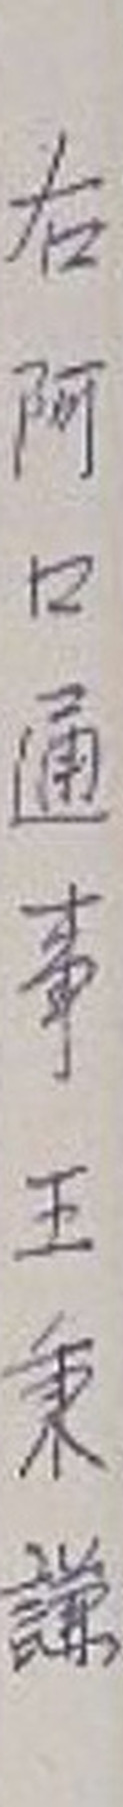右阿口通事王秉謙
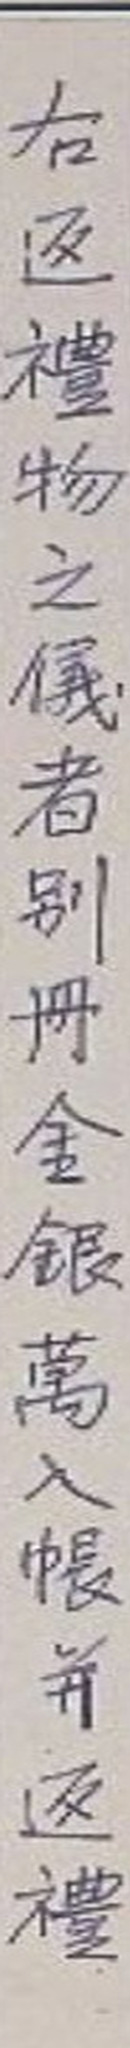右返礼物之儀者別冊金銀万入帳并返礼
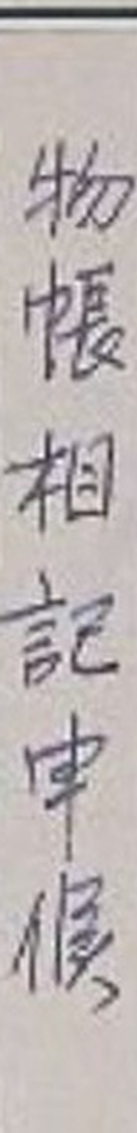物帳相記申候

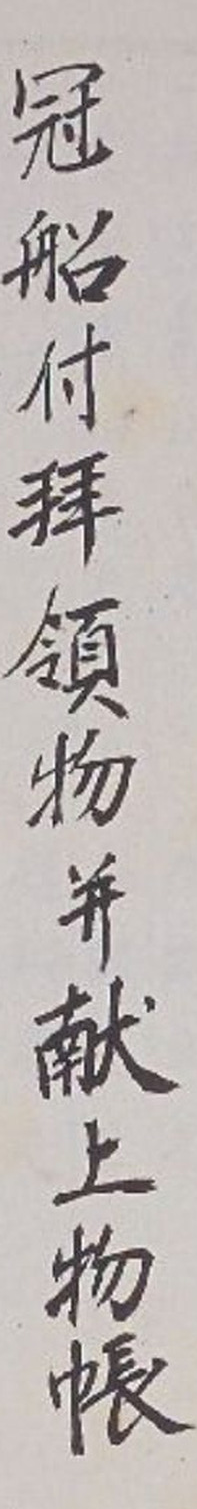冠船付拝領物并献上物帳

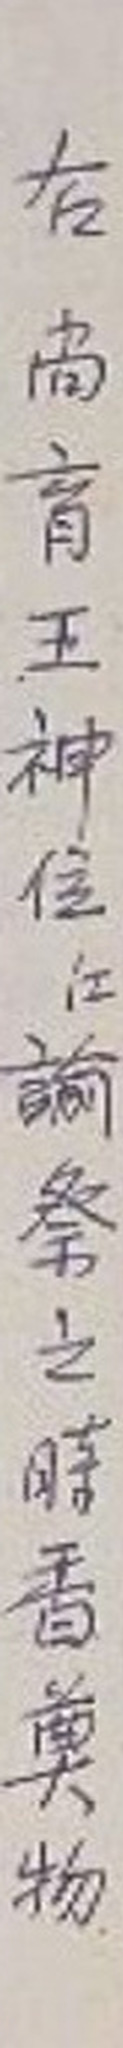右尚育王神位え諭祭之時香奠物
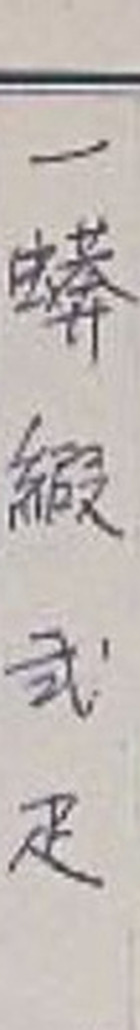一蟒緞弐疋
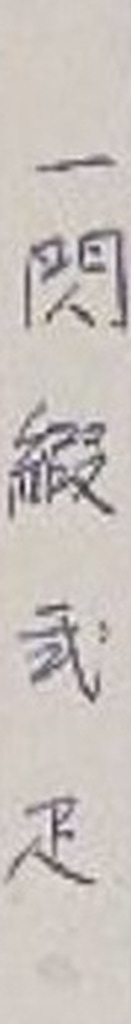一蟒緞弐疋
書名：支那冊封使来琉諸記 下巻
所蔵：University of the Ryukyus Library
